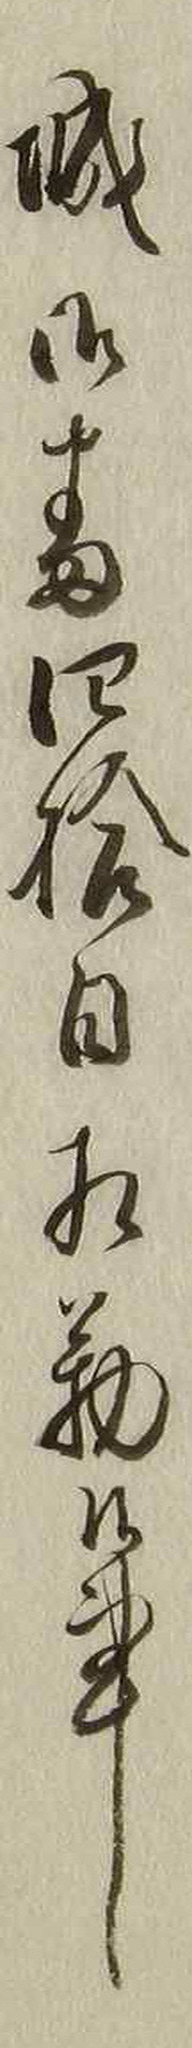城御番四拾日相勤候事
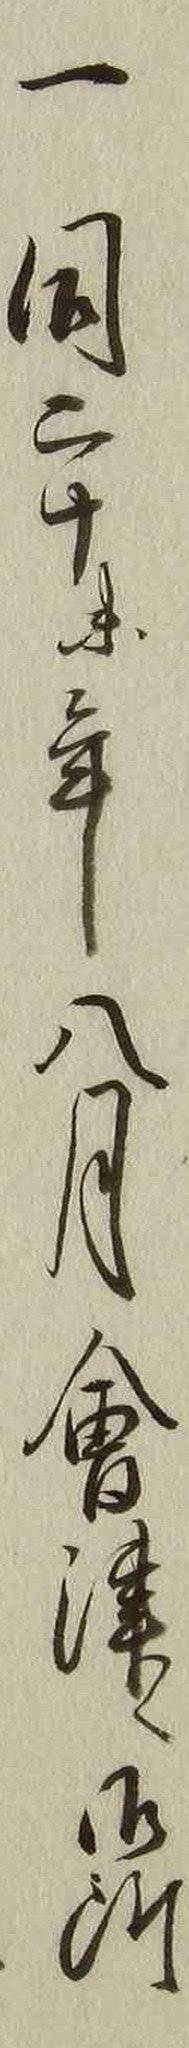一同二十未年八月会津へ御所
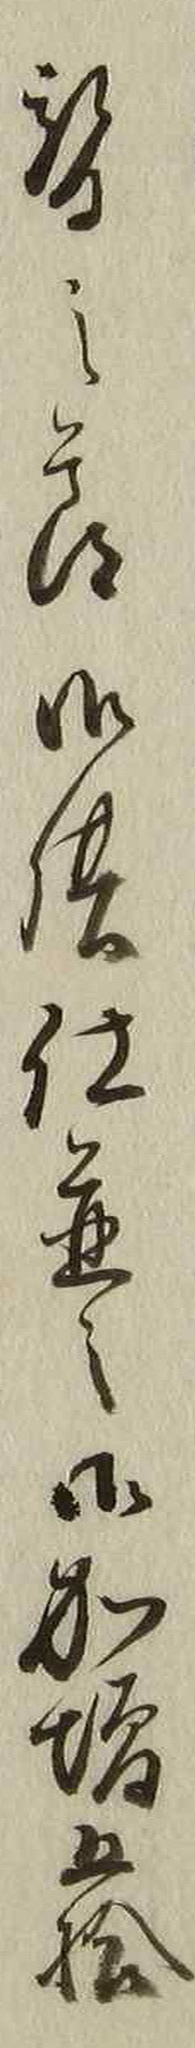替之節御供仕並之御加増五拾
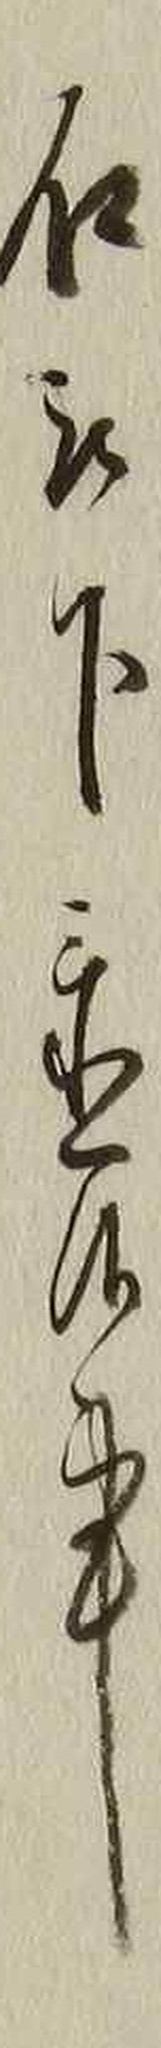石被下置候事
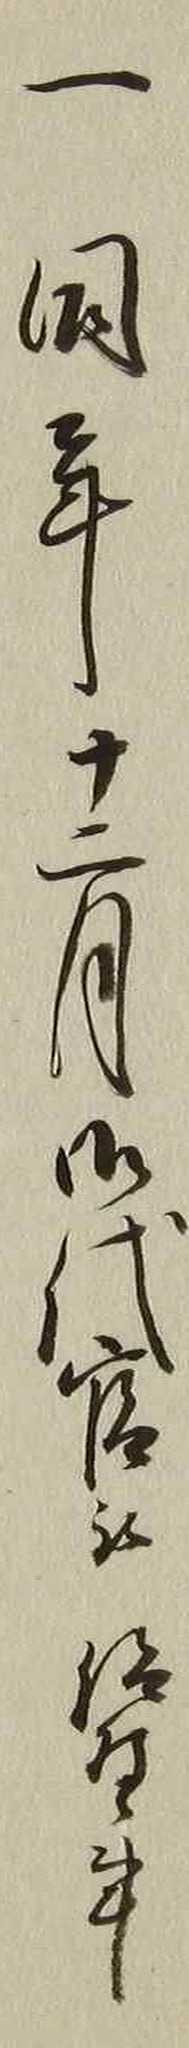一同年十二月御代官被仰付候事
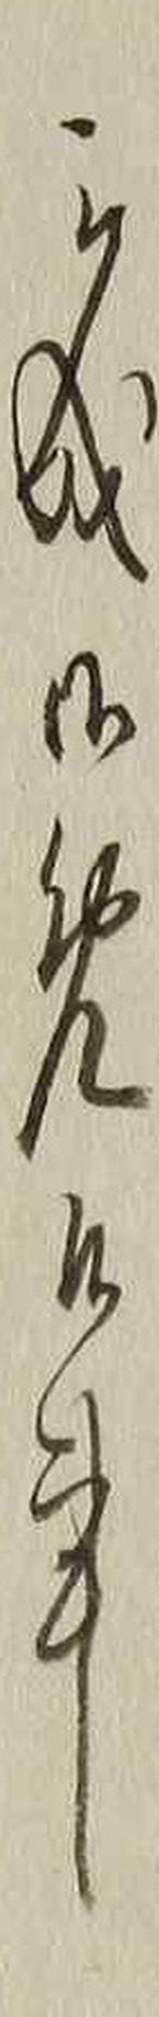被成御免候事
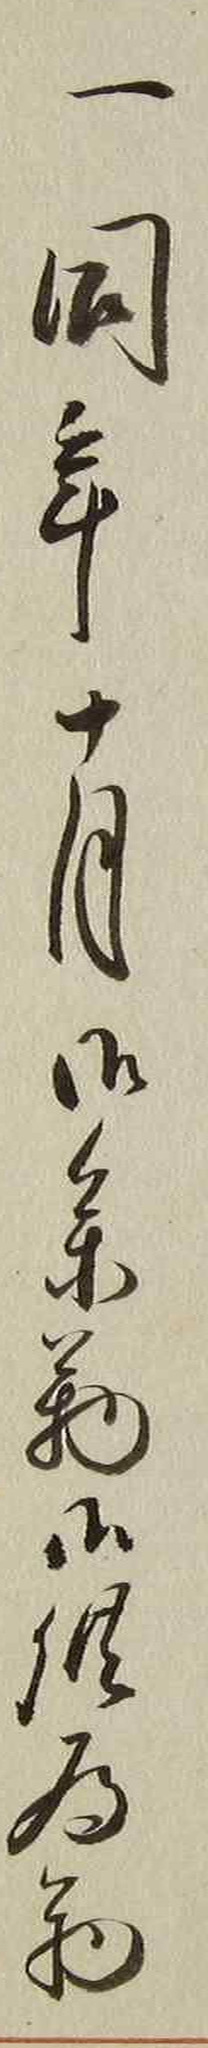一同年十月御参勤御供為勤
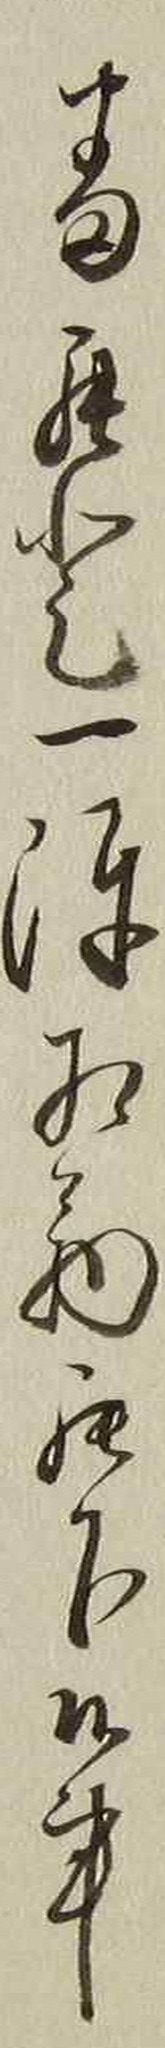番罷登一陣相勤罷下候事
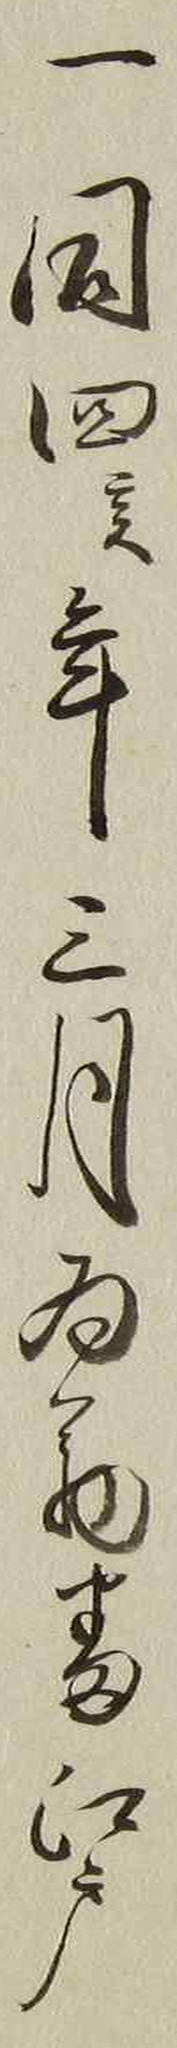一同四亥年三月為勤番江戸
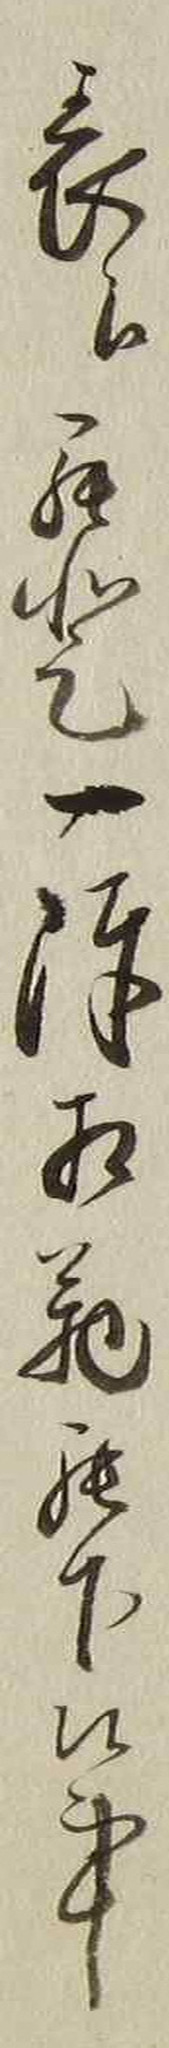表江罷登一陣相勤罷下候事
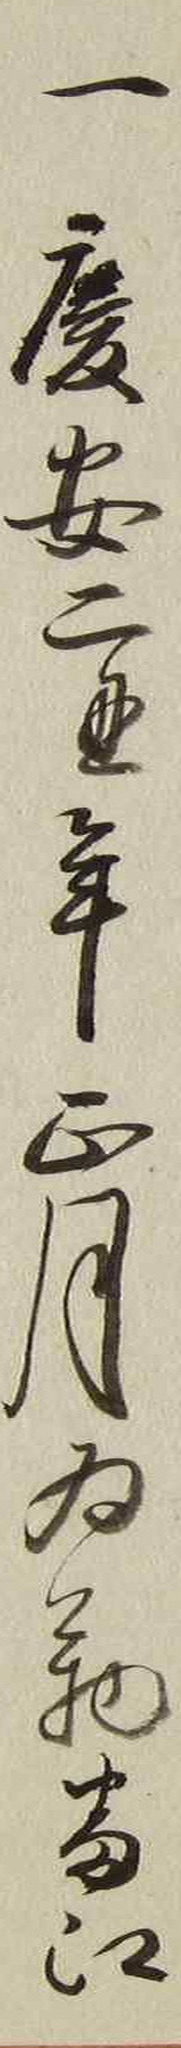一慶安二丑年正月為勤番江
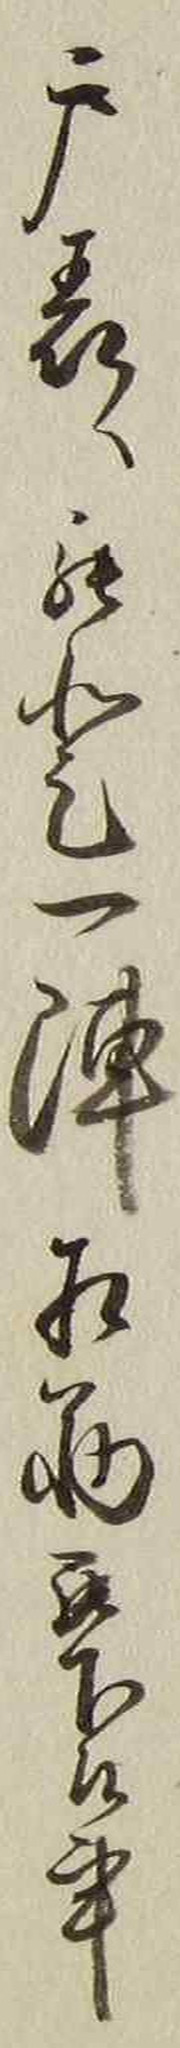戸表へ罷登一陣相勤罷下候事
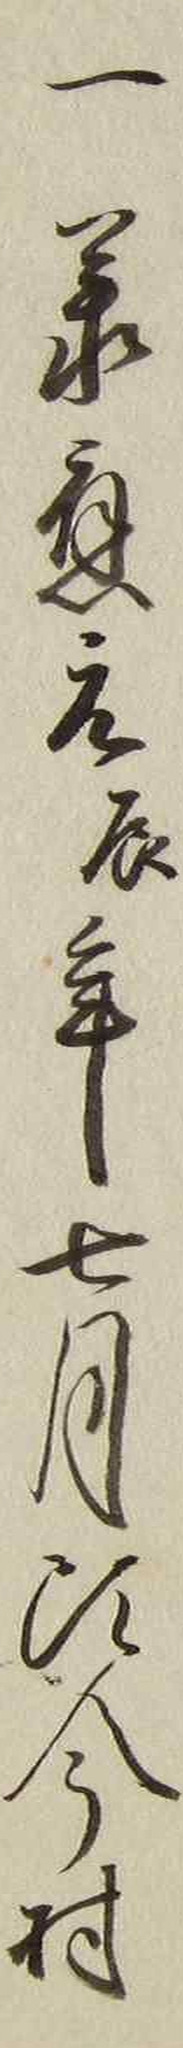一承応元辰年七月頭今村
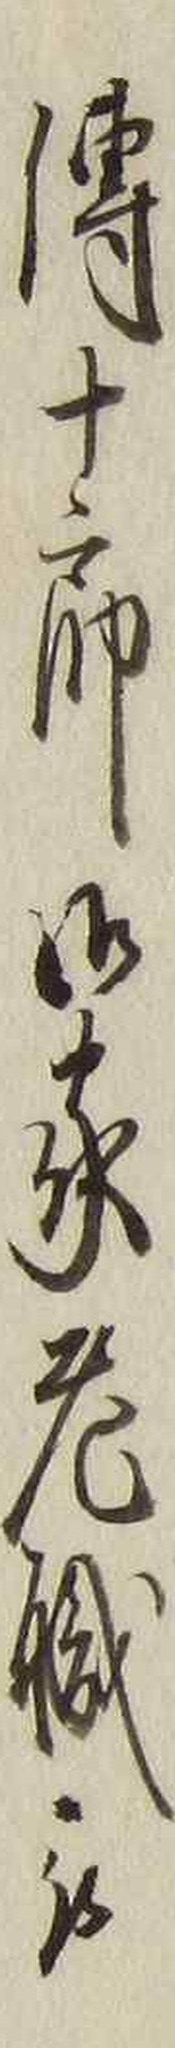伝十郎御家老職被

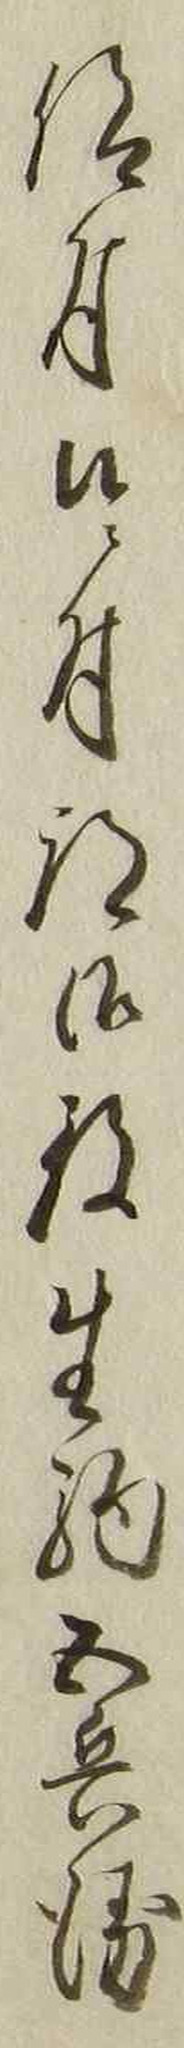仰付候ニ付跡御役生駒五兵衛
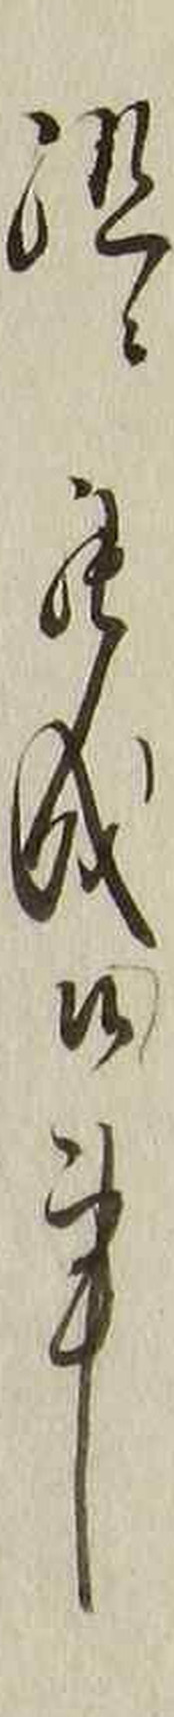組ニ罷成候事
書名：諸士系譜　巻之18　い之部18
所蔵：会津若松市立会津図書館
